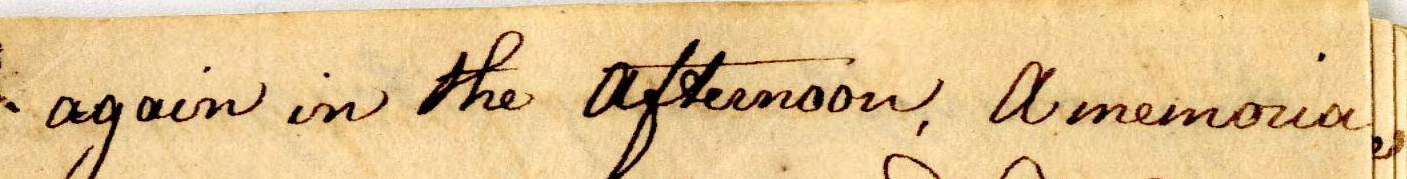again in the Afternoon, A memoria
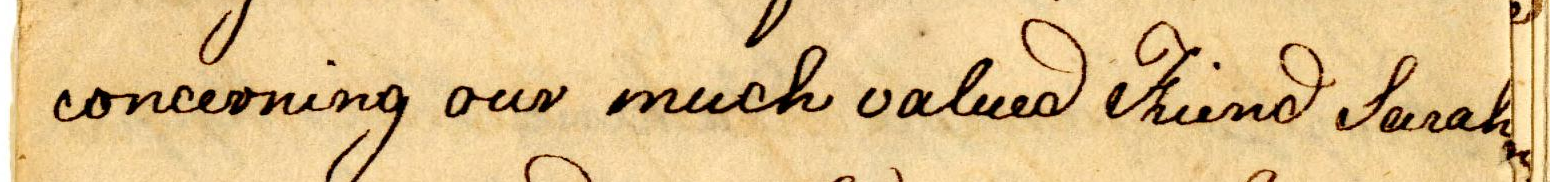concerning our much valued Friend Sarah
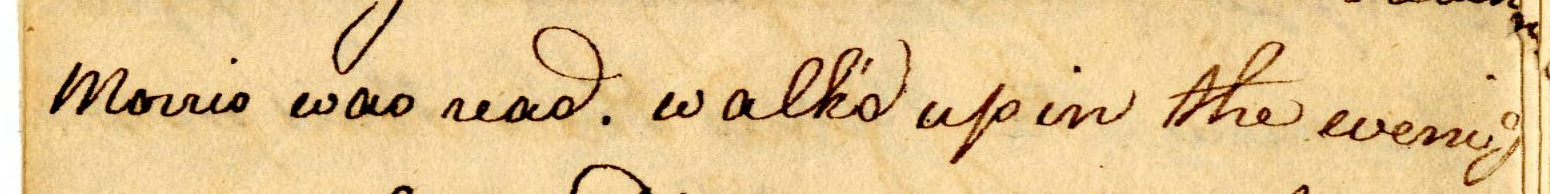Morris was read. walk'd up in the even^g
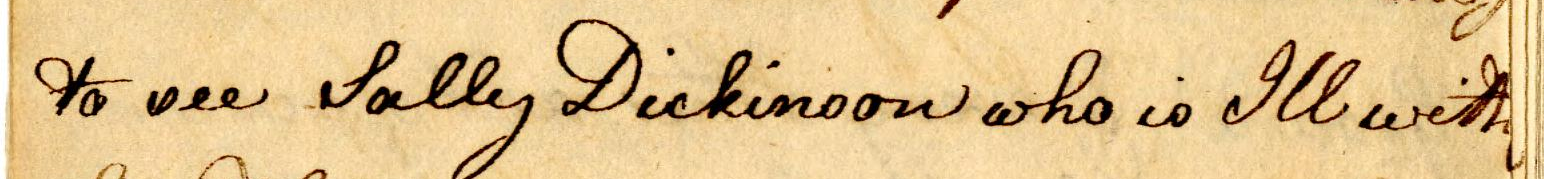to see Sally Dickinson who is Ill with
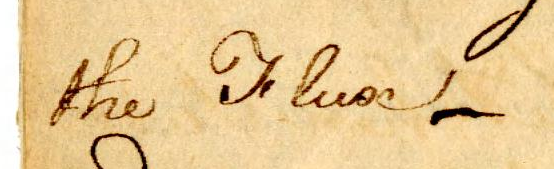the Flux-
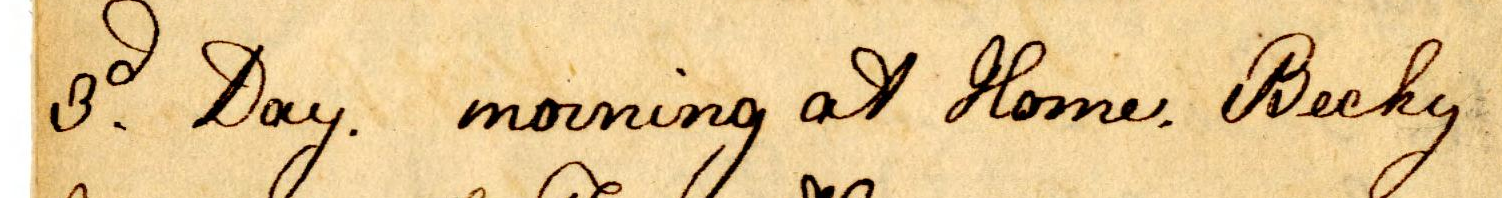3^d Day. morning at Home. Becky
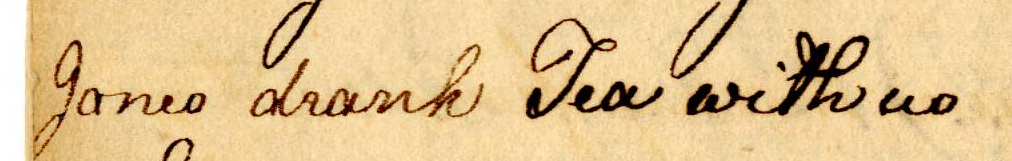Jones drank Tea with us
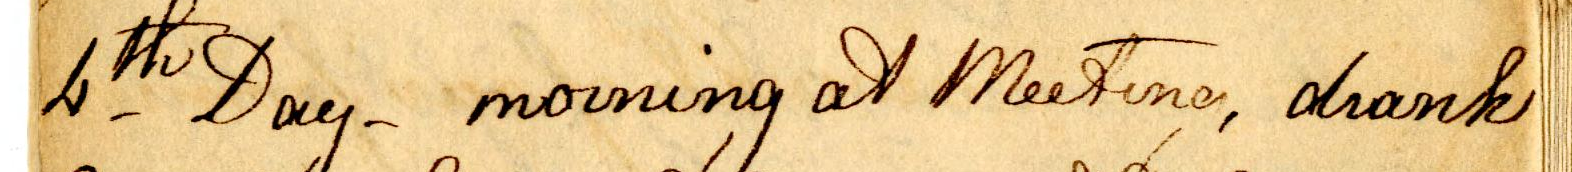4^th Day- morning at Meeting, drank
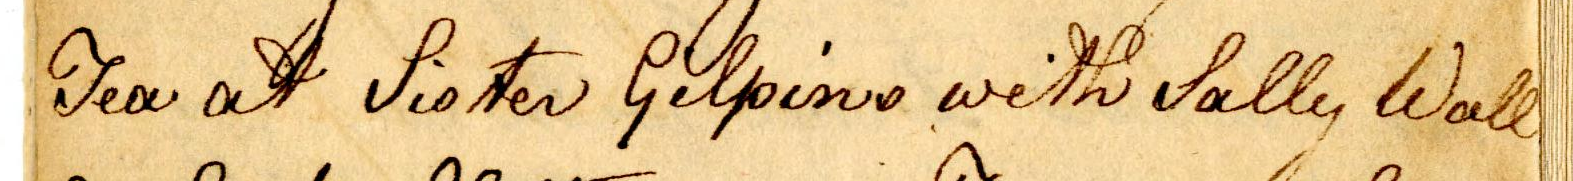Tea at Sister Gilpins with Sally Wall
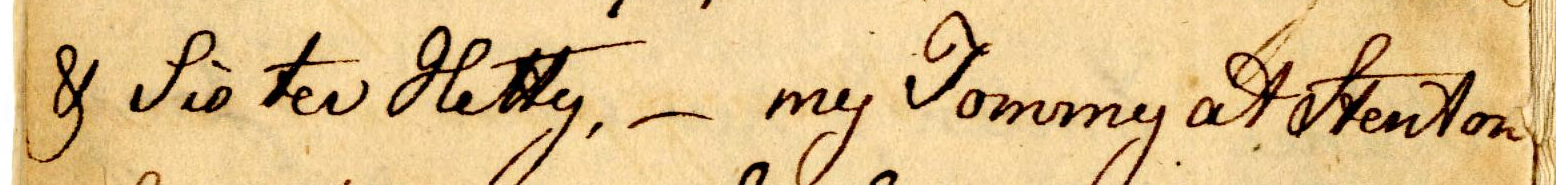& Sister Hetty,- my Tommy at Stenton
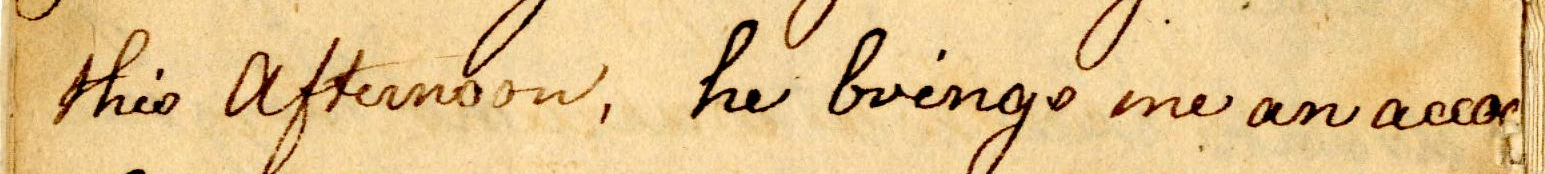this Afternoon, he brings me an accou
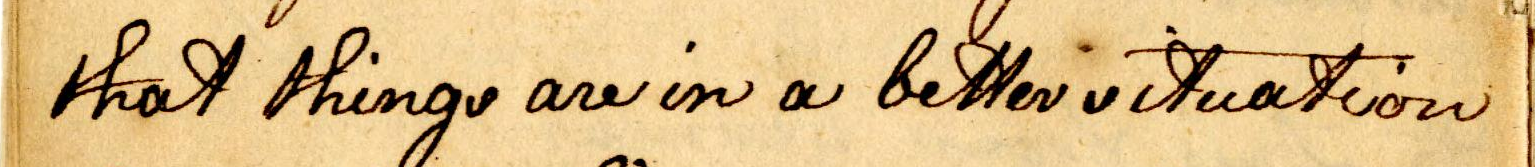that things are in a better situation
